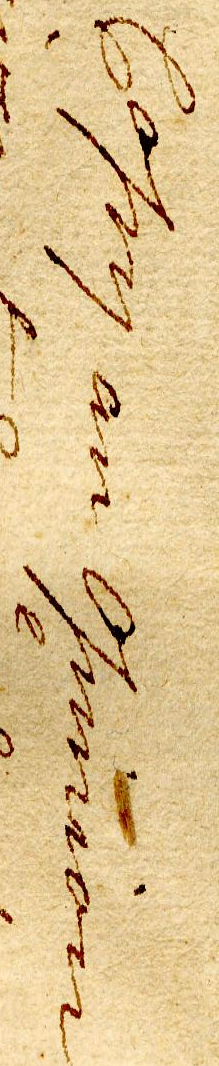Copy of Opinion
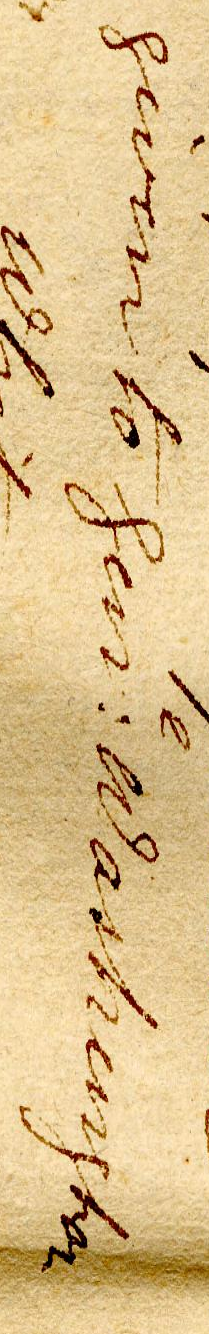given to Gen^l: Washington
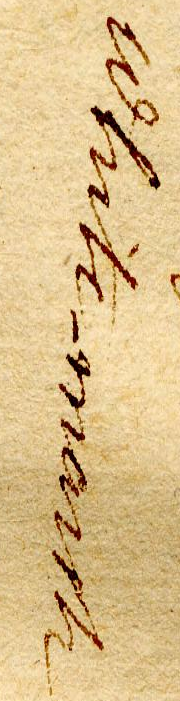White-Marth
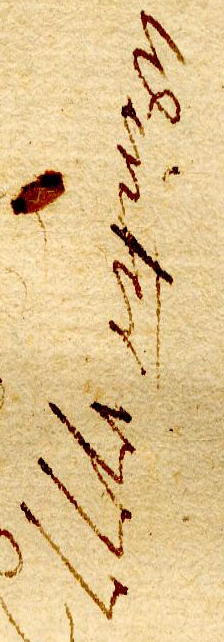Winter 1777
